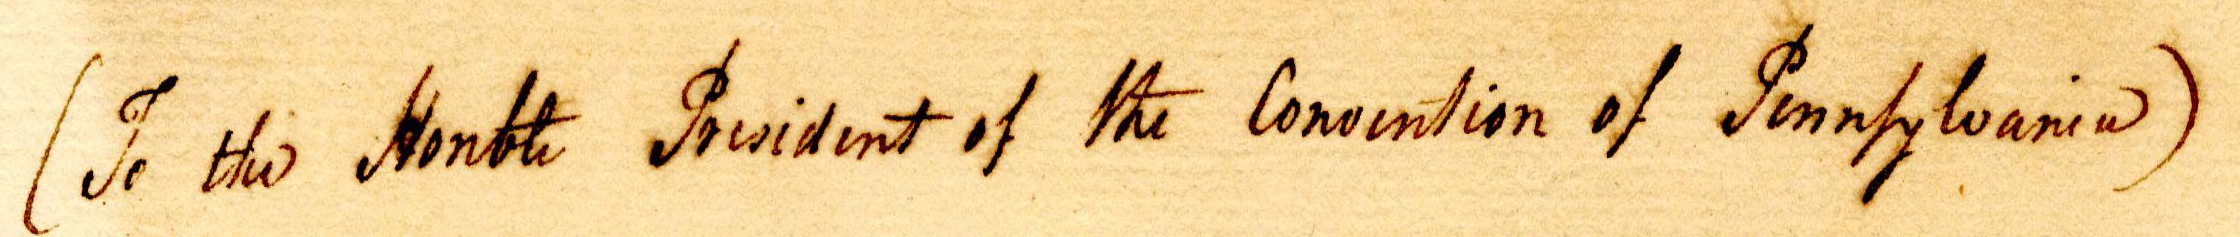(To the Honble President of the Convention of Pennsylvania)
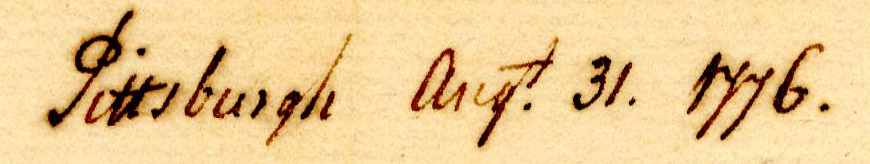Pittsburgh Aug^t. 31. 1776.
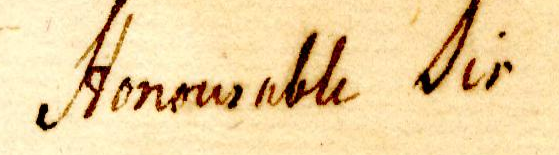Honourable Sir
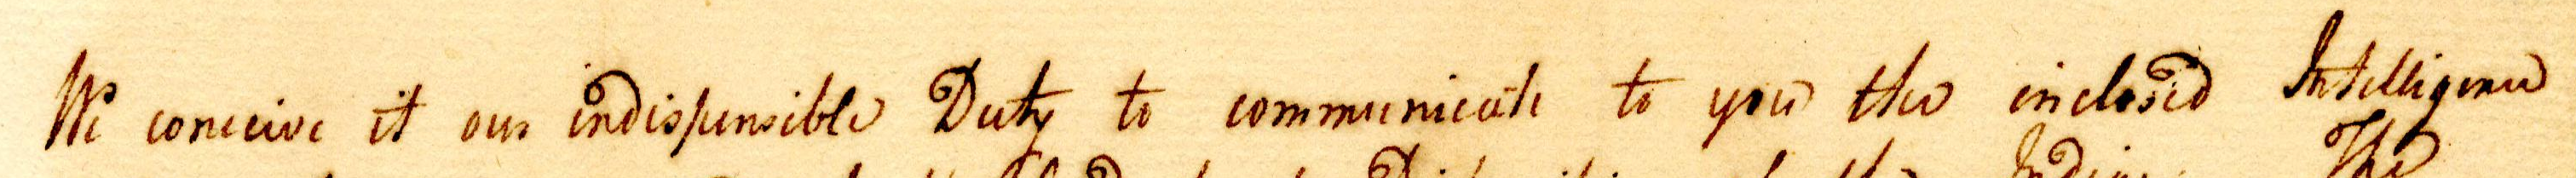We conceive it our indispensible Duty to communicate to you the inclosed Intelligence
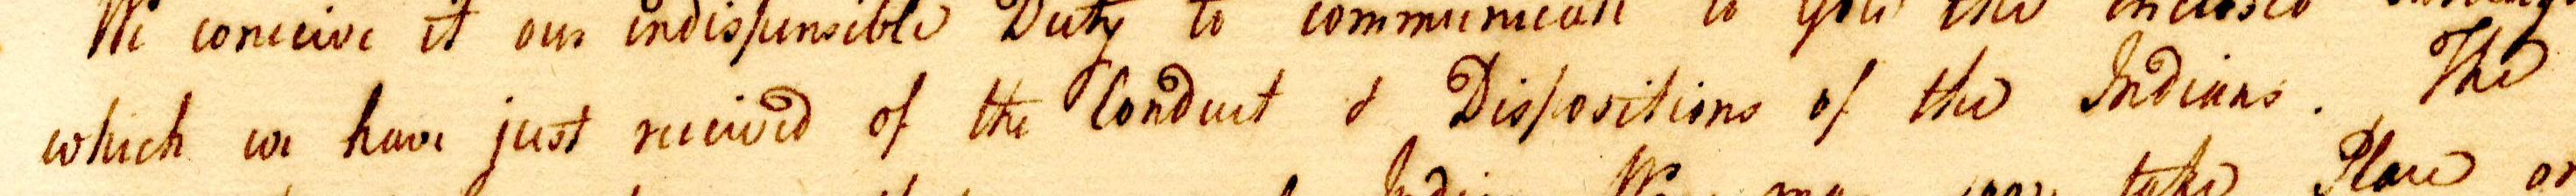which we have just received of the Conduct & Dispositions of the Indians. The
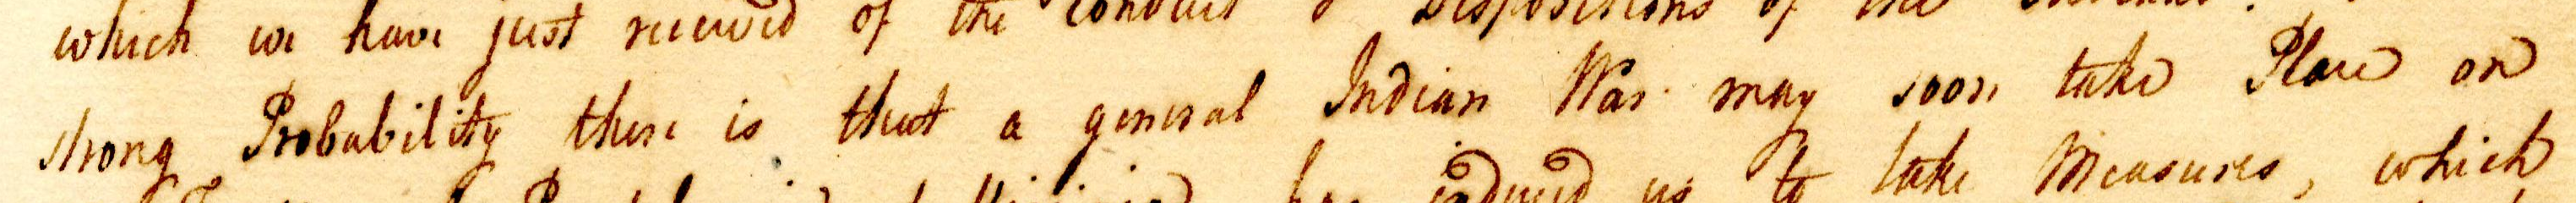strong Probability there is that a general Indian War may soon take Place on
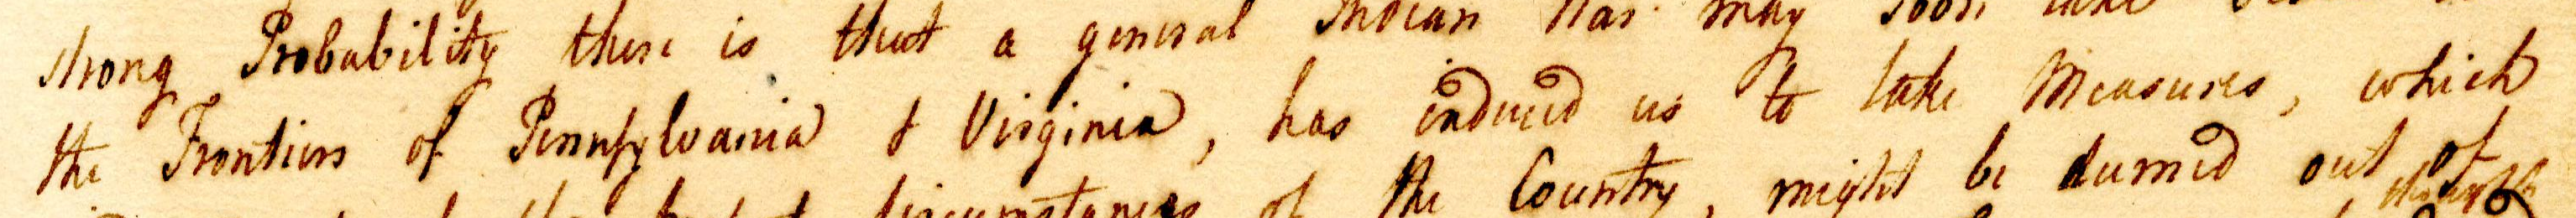the Frontiers of Pennsylvania & Virginia, has induced us to take Measures, which
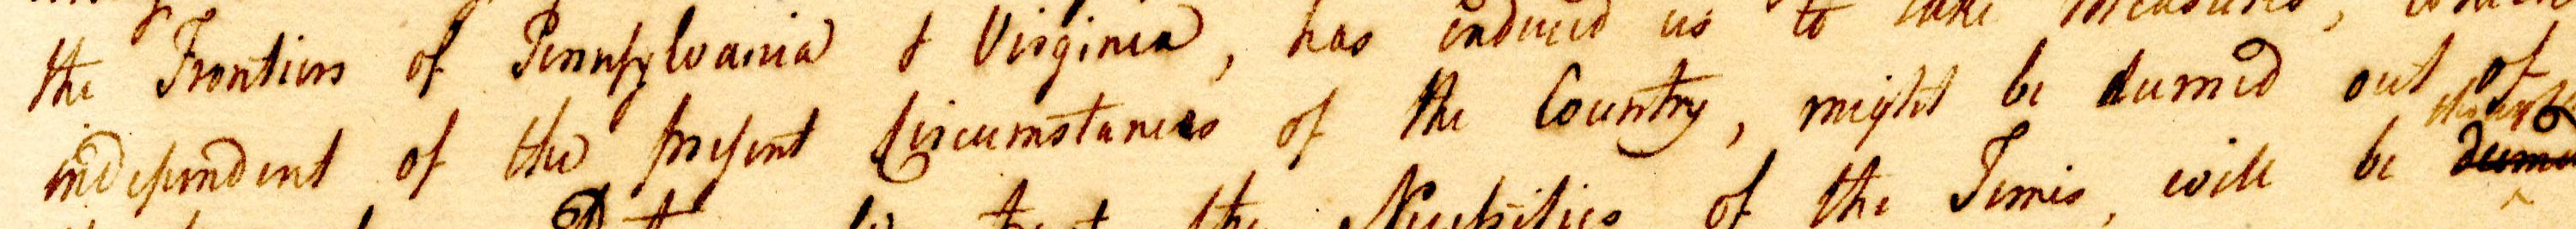independent of the present Circumstances of the Country, might be deemed out of
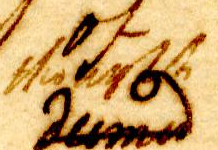therefore
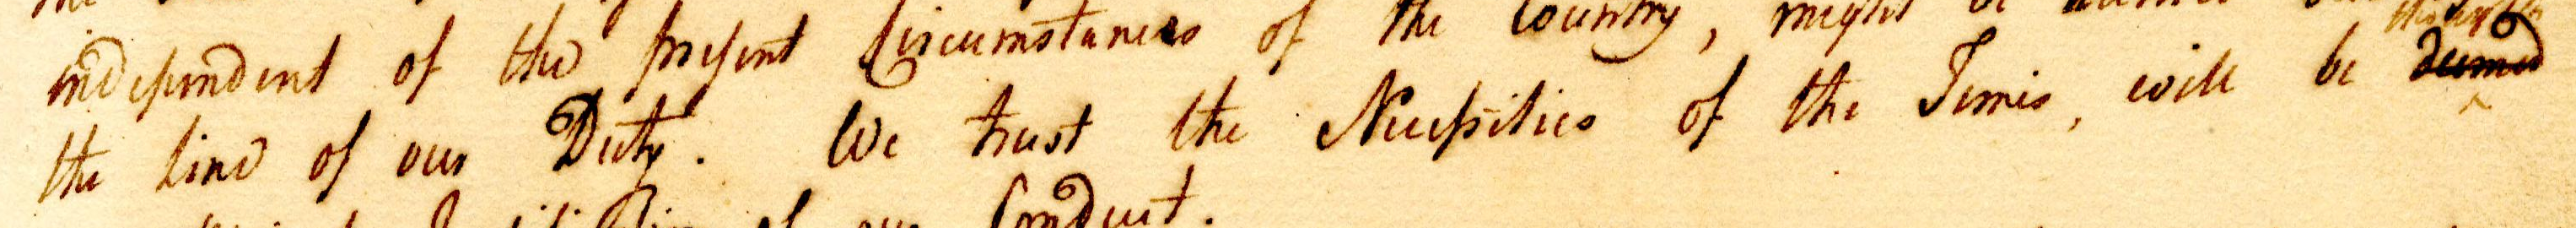the Line of our Duty. We trust the Necessities of the Times will be deemed
